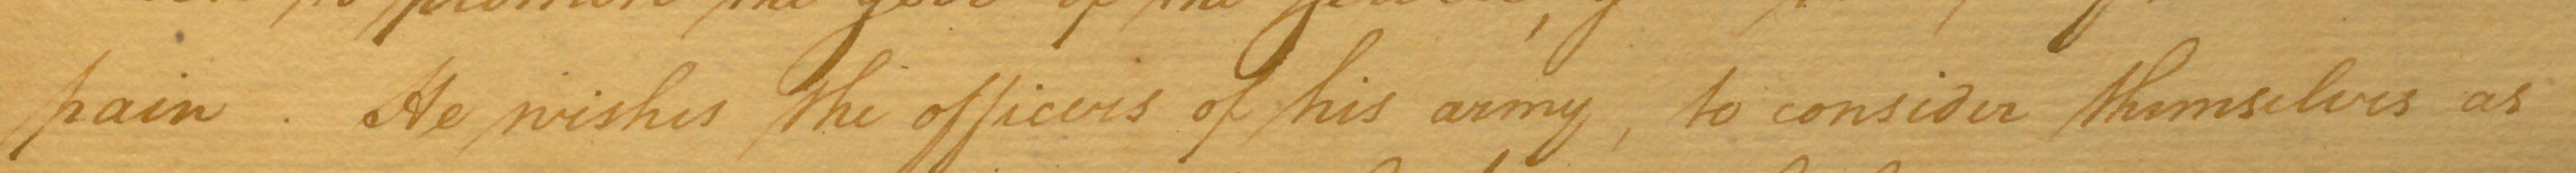pain. He wishes the officers of his army, to consider themselves as
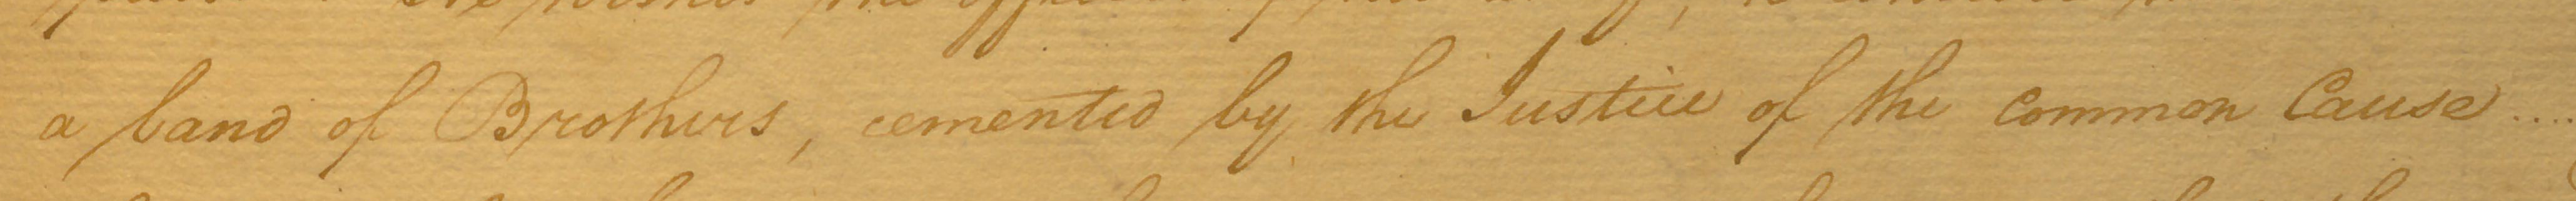a band of Brothers, cemented by the Justice of the common Cause...
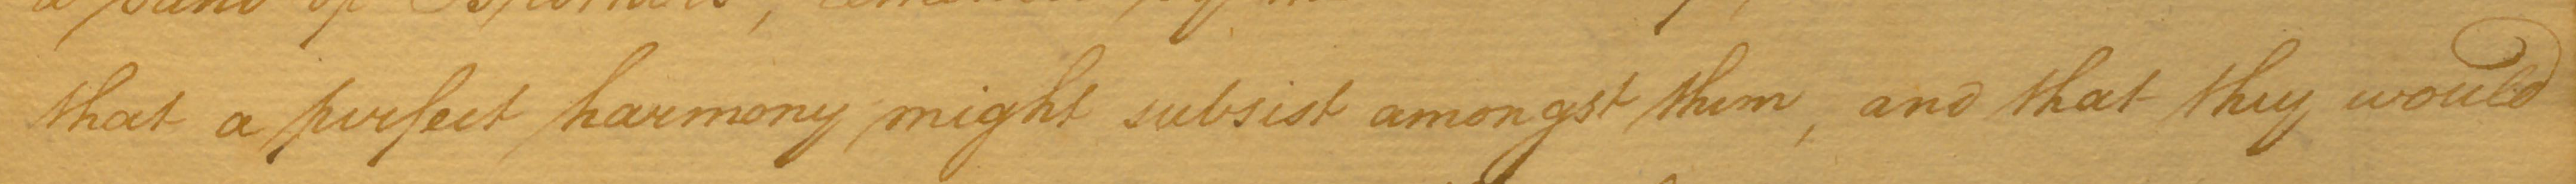that a perfect harmony might subsist amongst them, and that they would
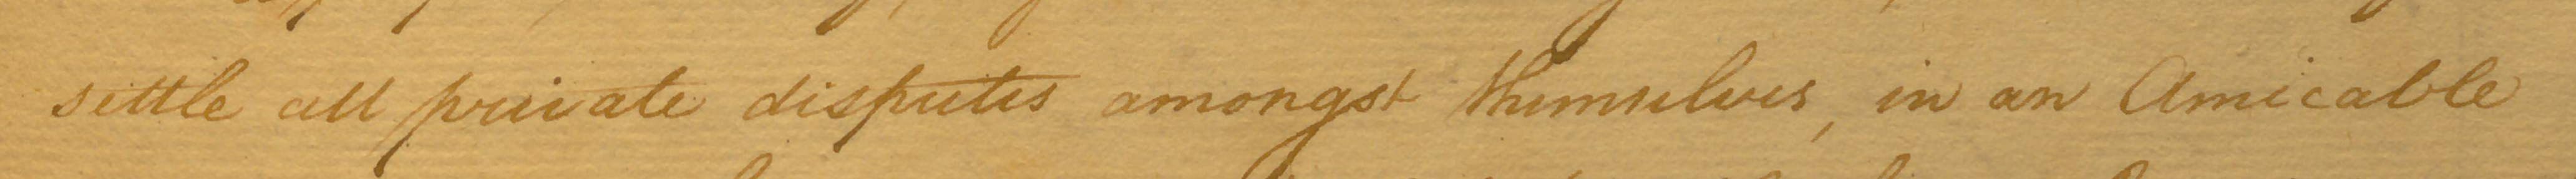settle all private disputes amongst themselves, in an Amicable
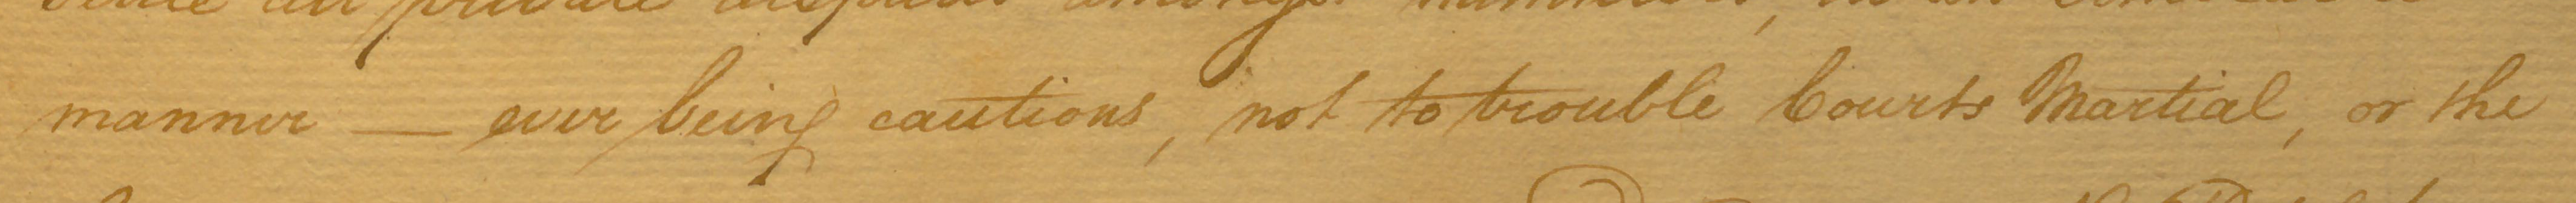manner- ever being cautious, not to trouble Courts Martial, or the
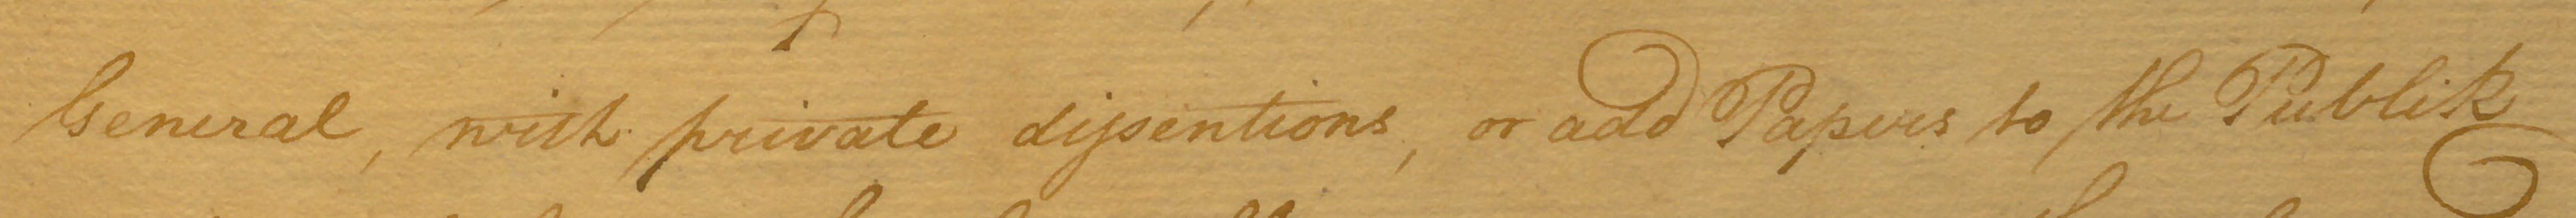General, with private dissentions, or add Papers to the Publick
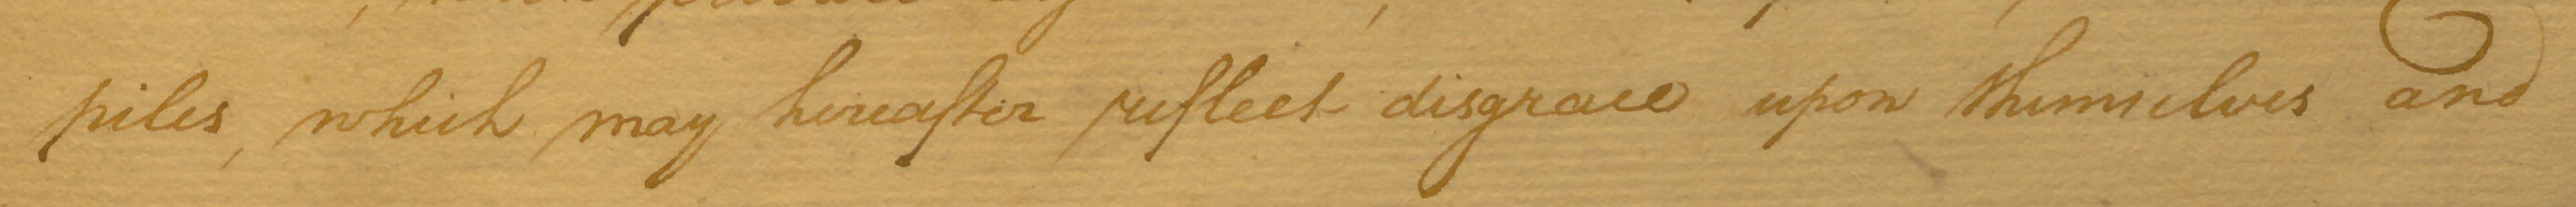piles, which may hereafter reflect disgrace upon themselves and
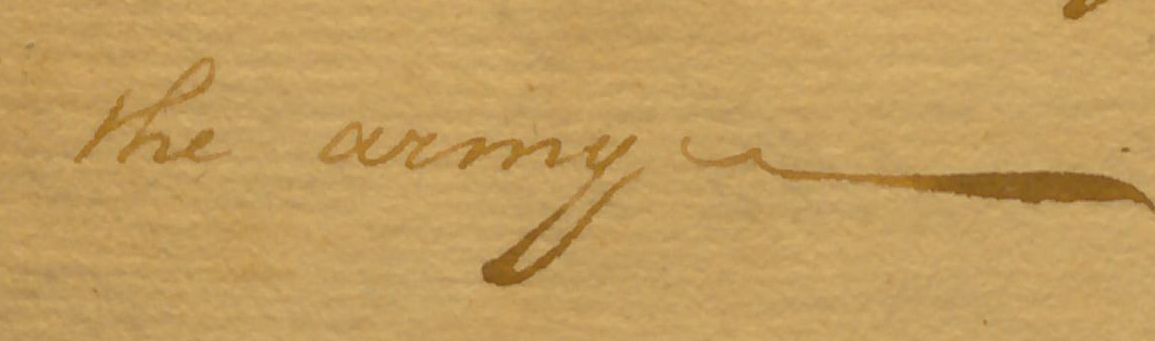the army-
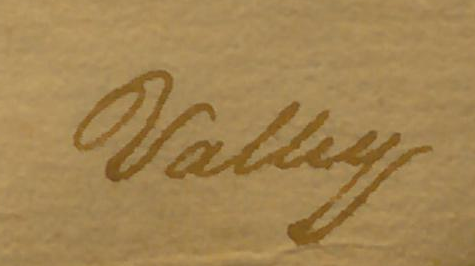Valley
